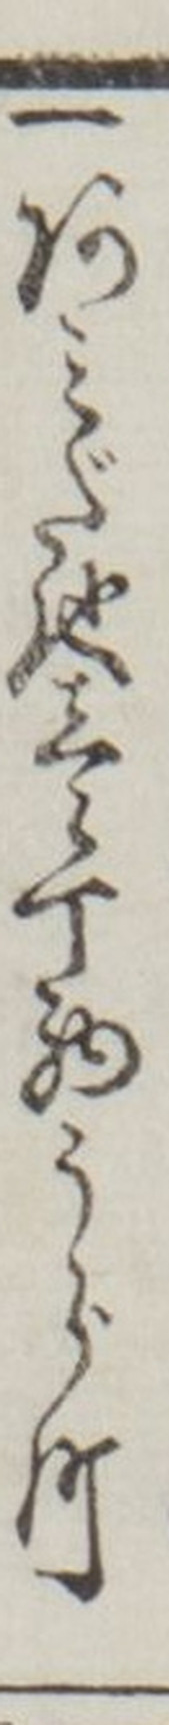一あみだ池壱丁西うら町
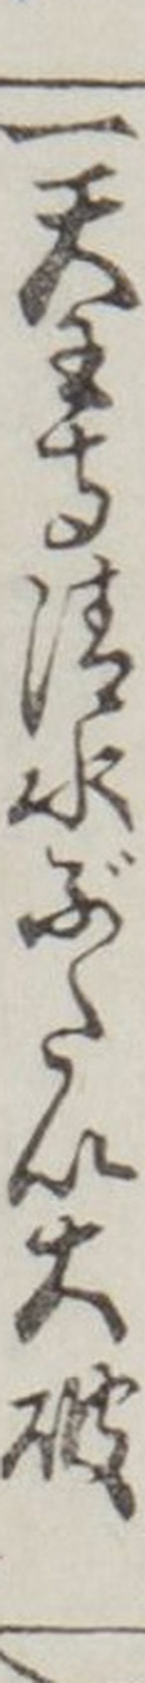一天王寺清水ぶたい大破
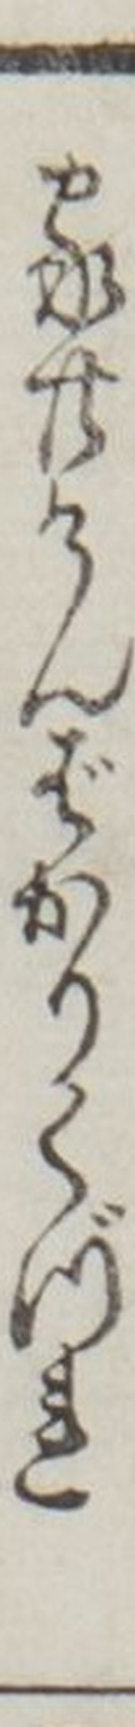家廿けんばかりくづれ
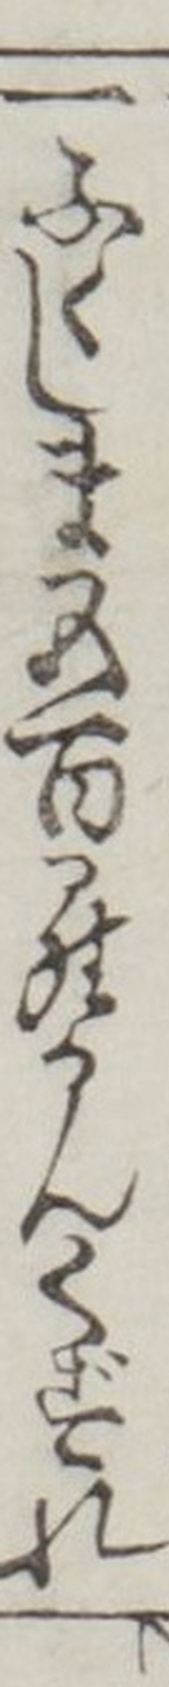一ふくしま五百らかんくずれ
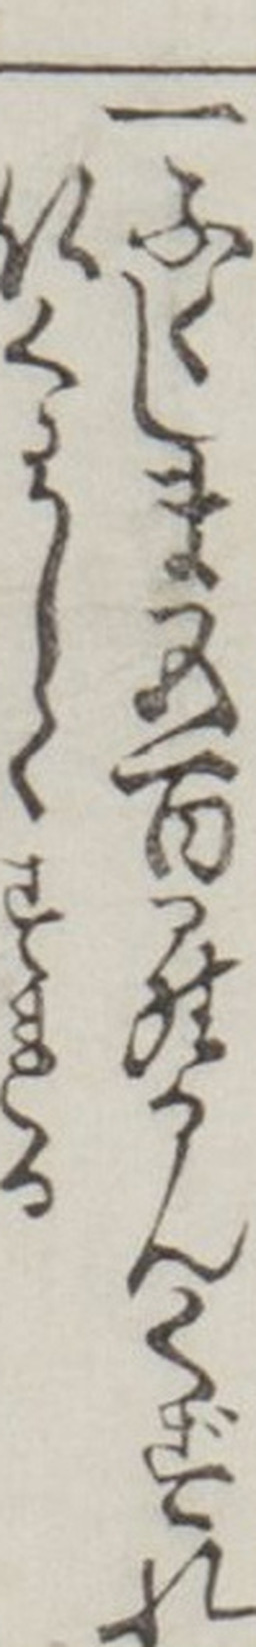いくわしくすれる
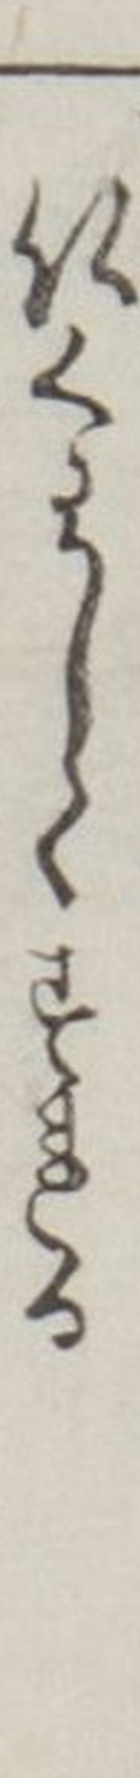いくわしくすれる
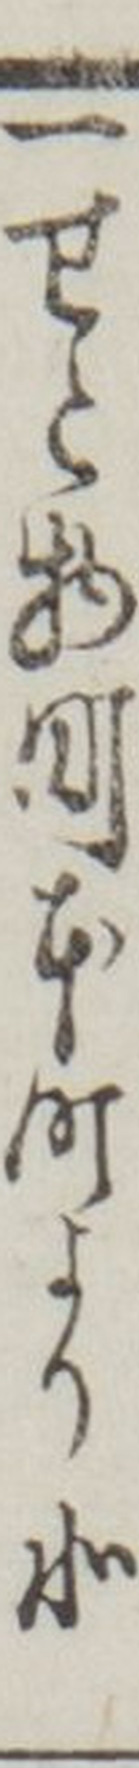一せと物町本町より北
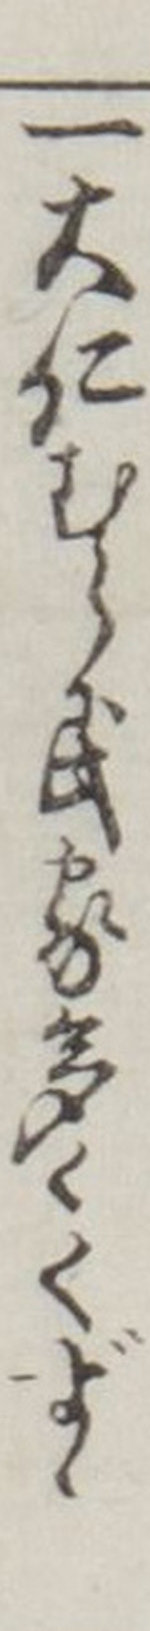一大仁むら民家多くくずゝ
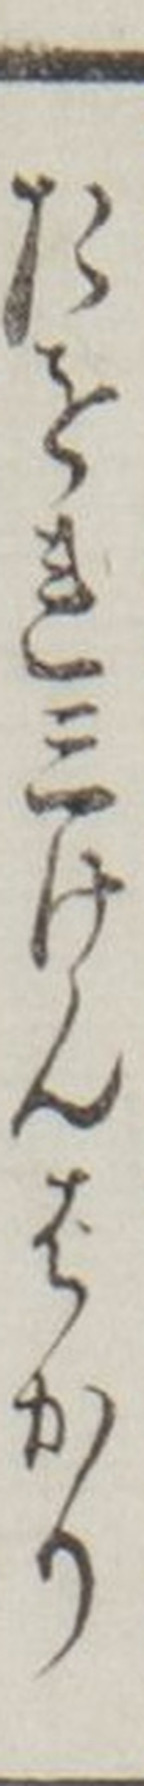たをれ三けんばかり
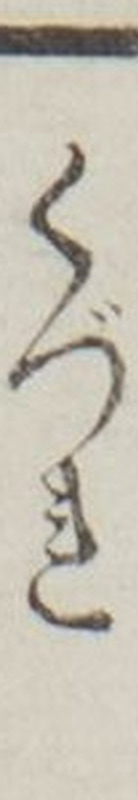くづれ
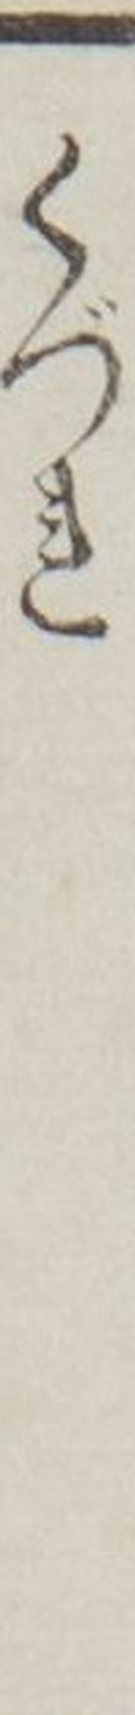くづれ
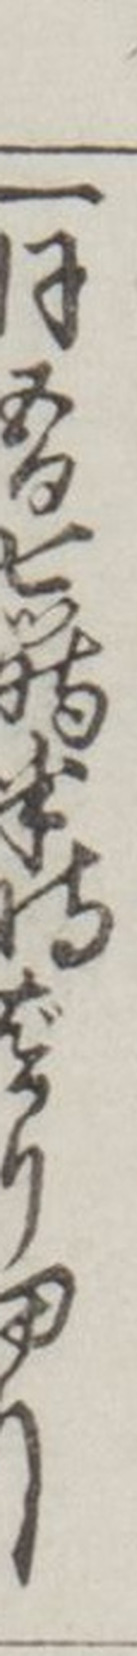一同五日七ッ時半時ばかりゆり
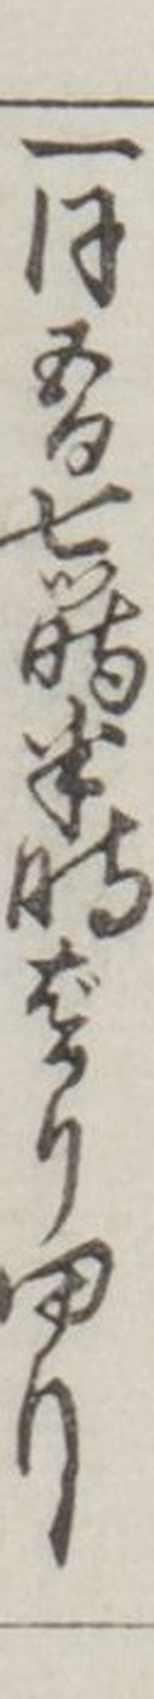一同五日七ッ時半時ばかりゆり
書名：本志らべ大阪大地震大破略記
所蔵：あいおいニッセイ同和損保株式会社
